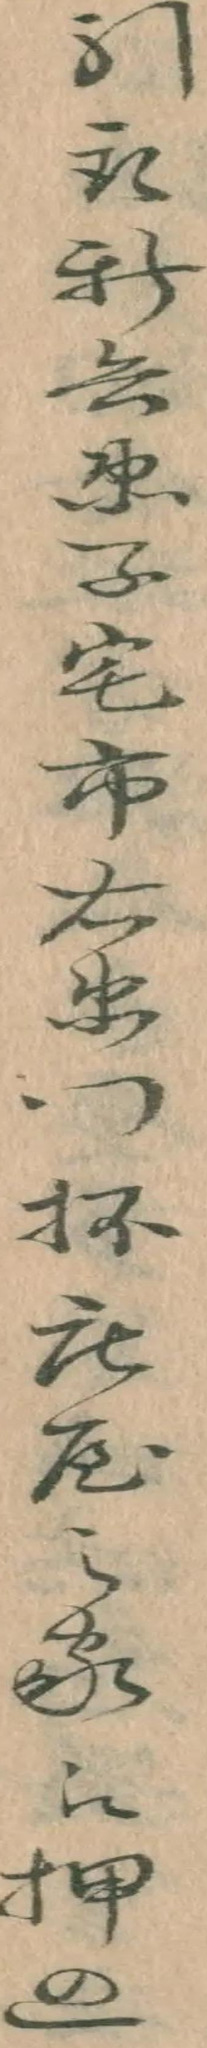引取新兵衛子宅市右衛門抔庄屋之家え押込
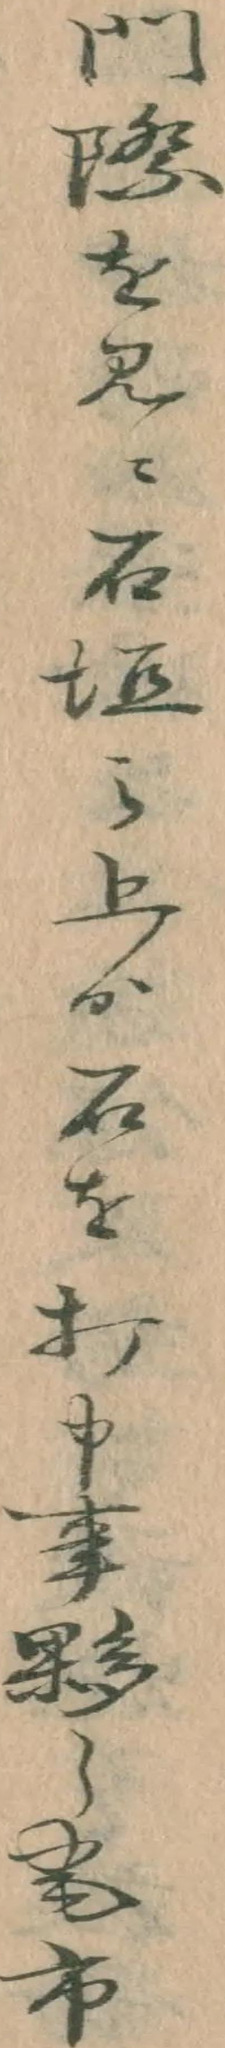門際を見に石垣之上ゟ石を打申事夥し宅市
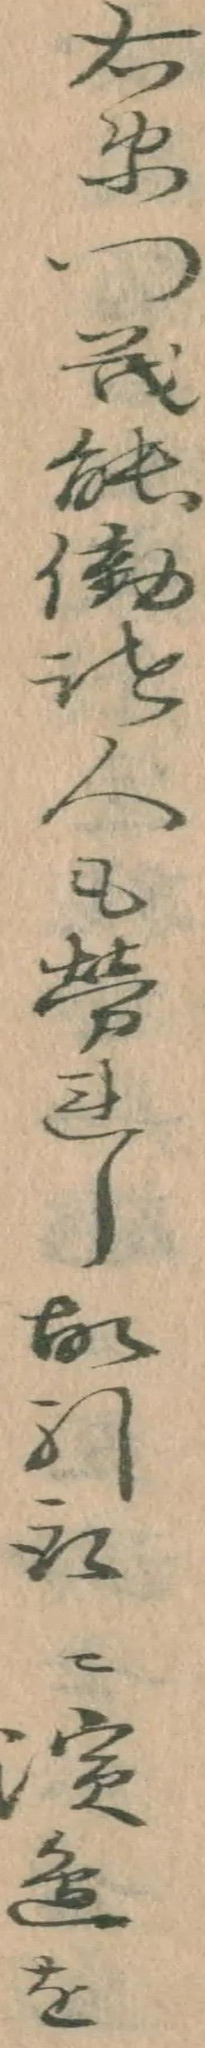右衛門も能働諸人も労れし故引取に浜辺を
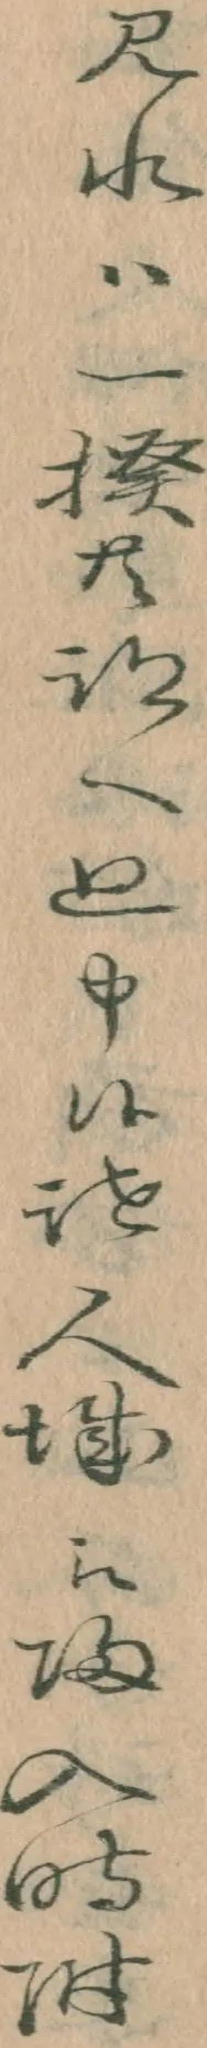見れは一揆共跡へ廻申候諸人城え帰入時附
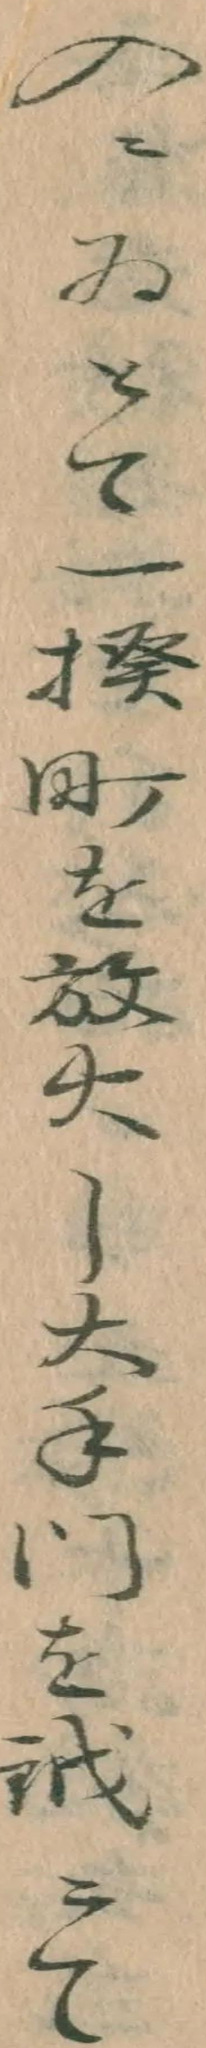入にゐとて一揆町を放火し大手門を鉞にて
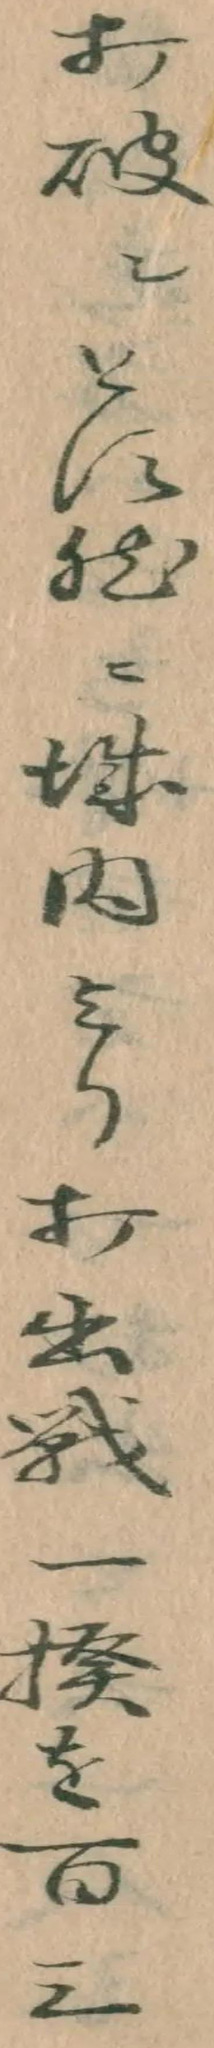打破んとす然に城内より打出戦一揆を百三
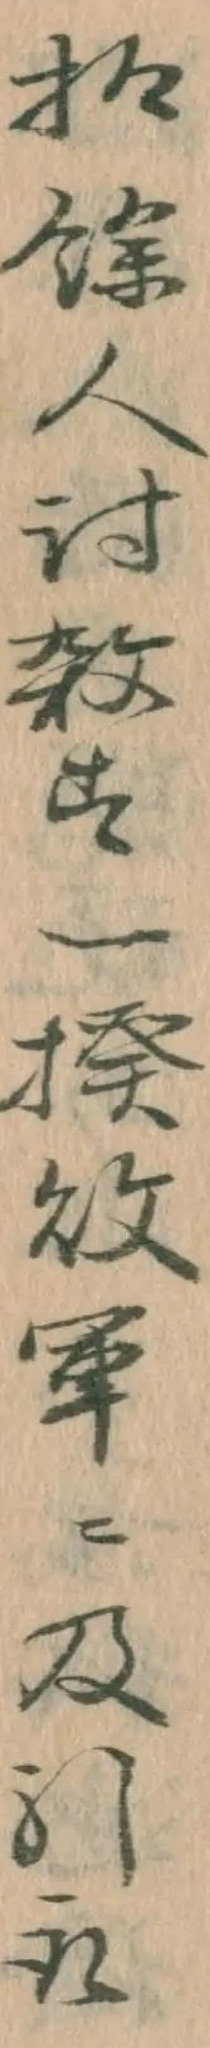拾余人討殺す一揆敗軍に及引取
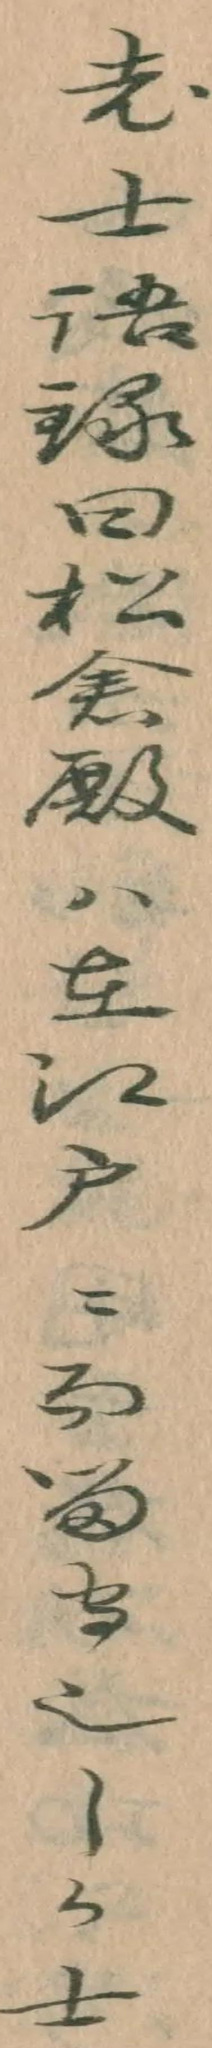老士語録日松倉殿は在江戸に而留守也しか士
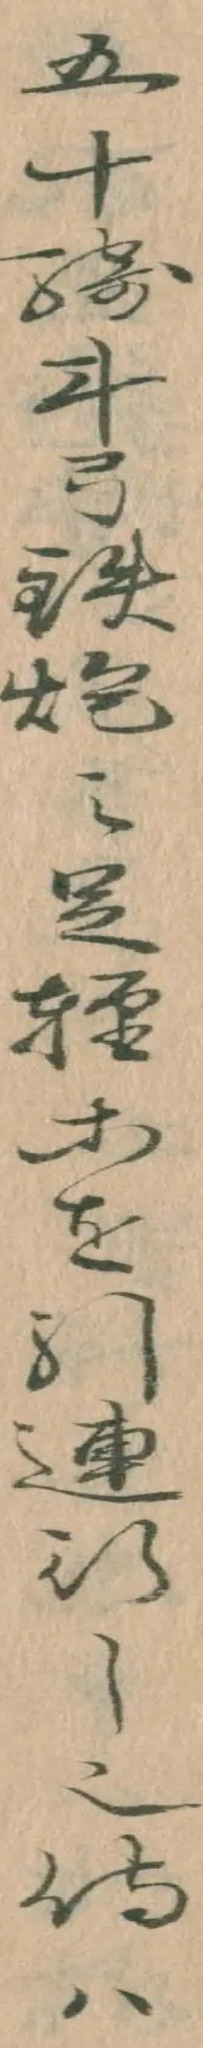五十騎斗弓鉄炮之足軽等を引連行し也侍は
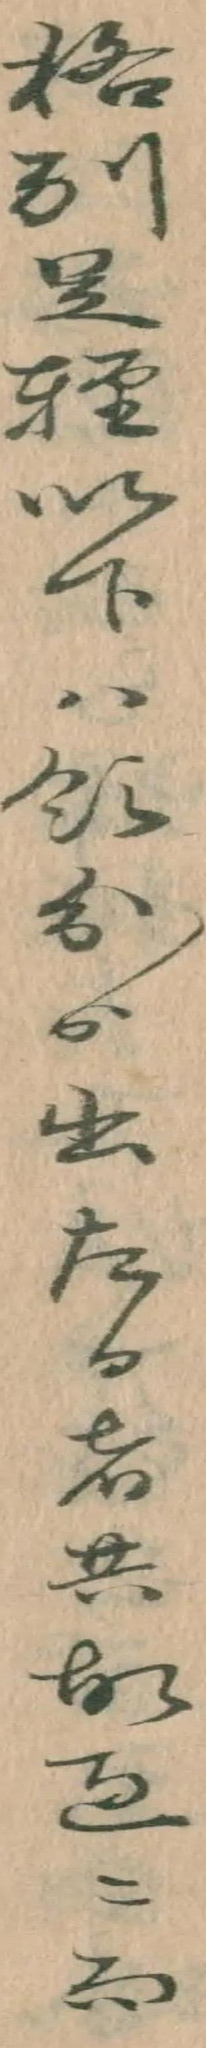格別足軽以下は領分ゟ出たる者共故過に而
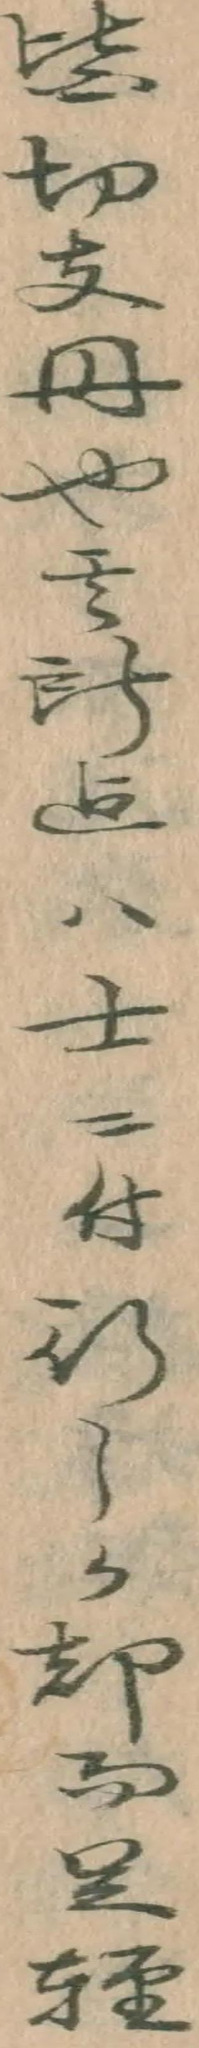皆切支丹や其所迄は士に付行しか却而足軽
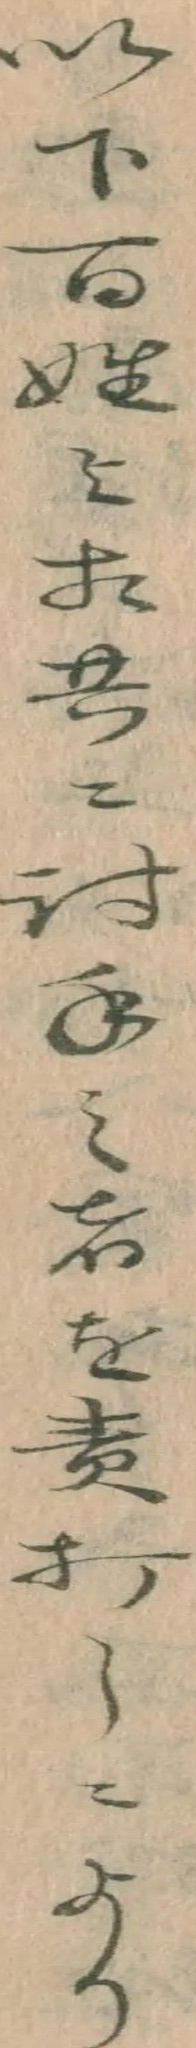以下百姓与相共に討手之者を責打しにより
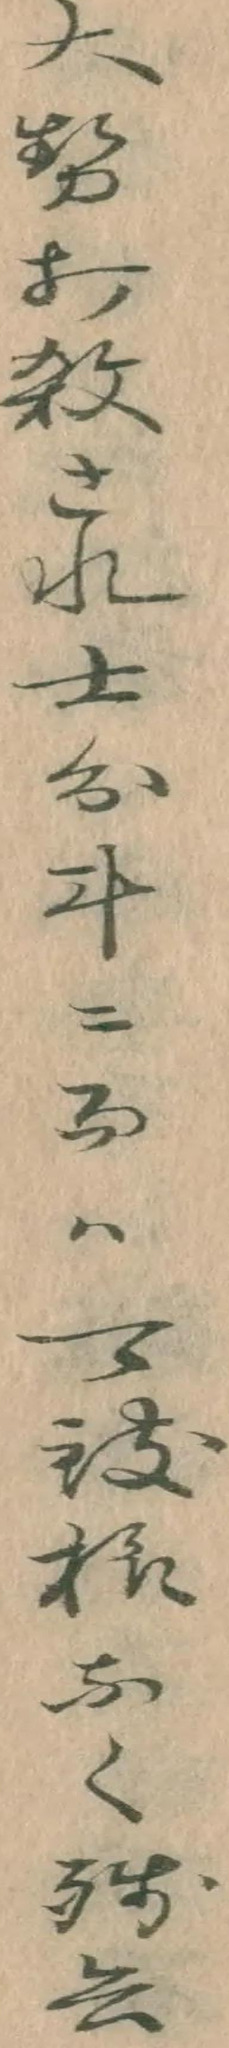大勢打殺され士分斗に而は可致様なく残兵
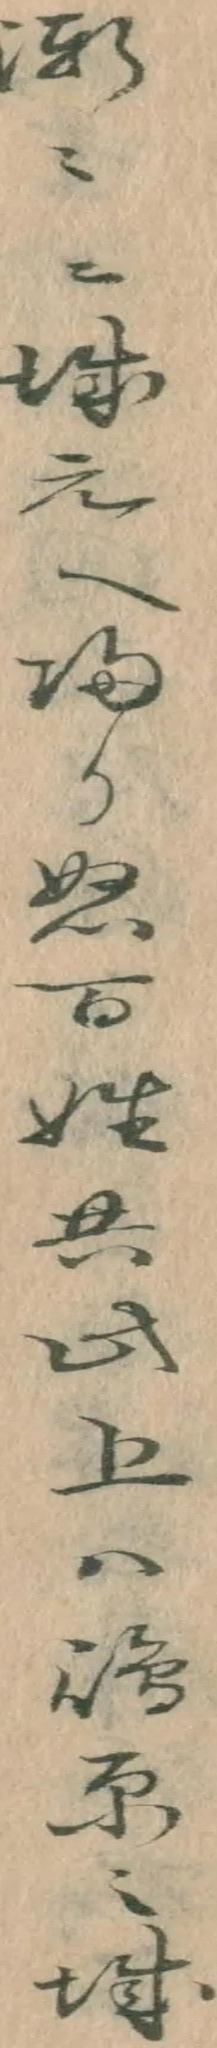漸々に城元へ帰りぬ百姓共此上は島原之城
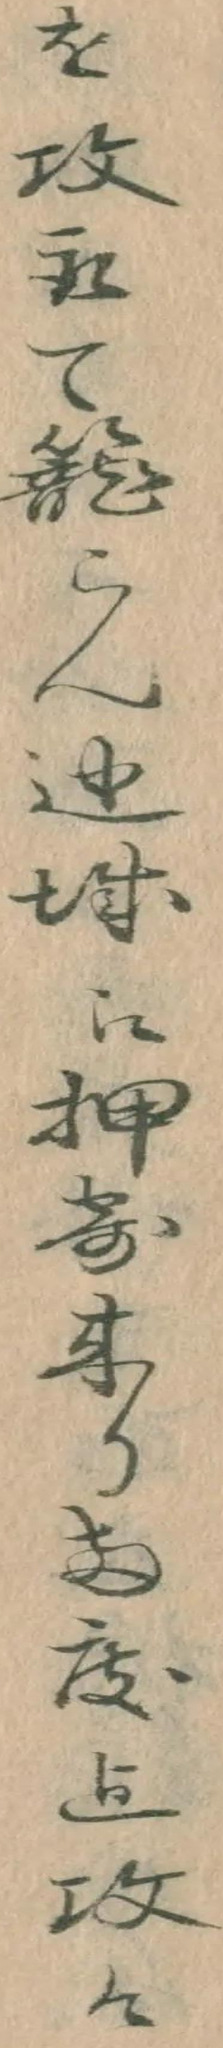を攻取て籠らん迚城え押寄来り両度迄攻け
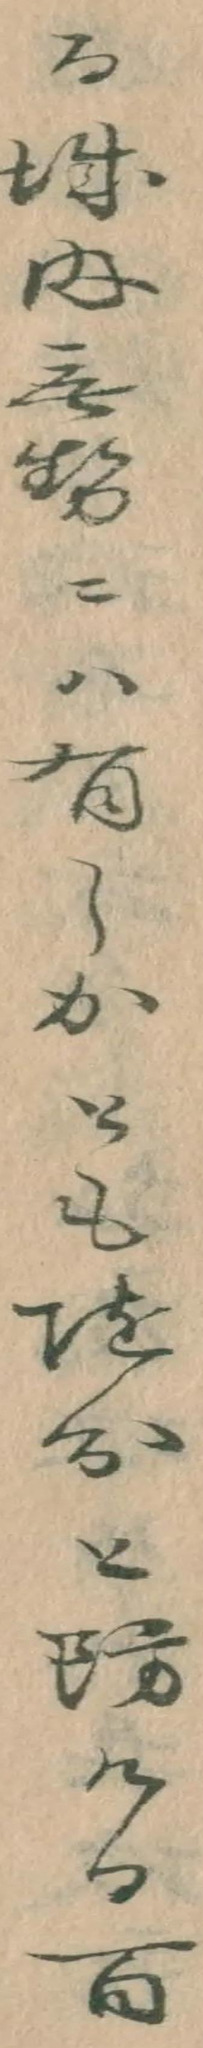る城内無勢には有しかとも随分と防ける百
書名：切支丹御退治記 49巻. [1]
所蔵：国立国会図書館 National Diet Library, JAPAN
